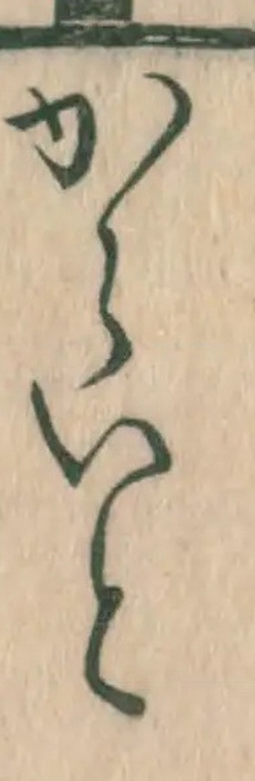からいと

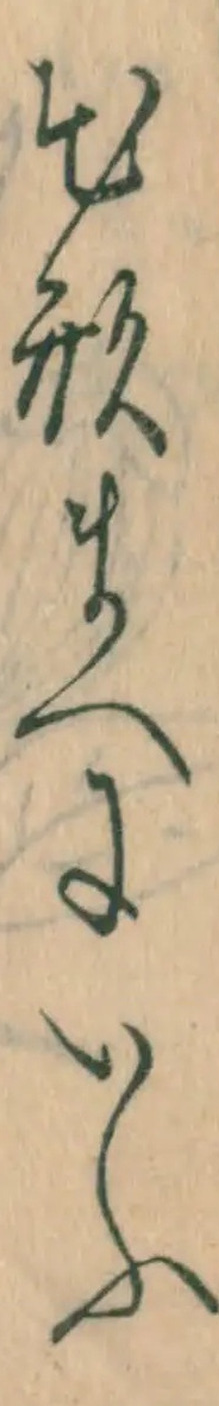花形まへにいふ
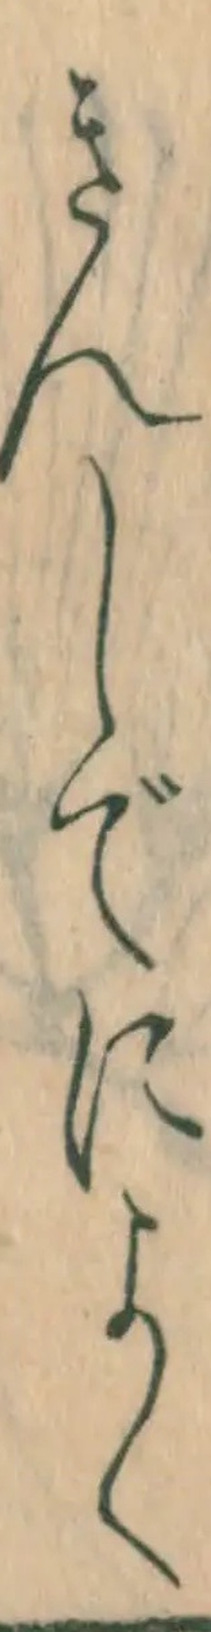きんしでによく
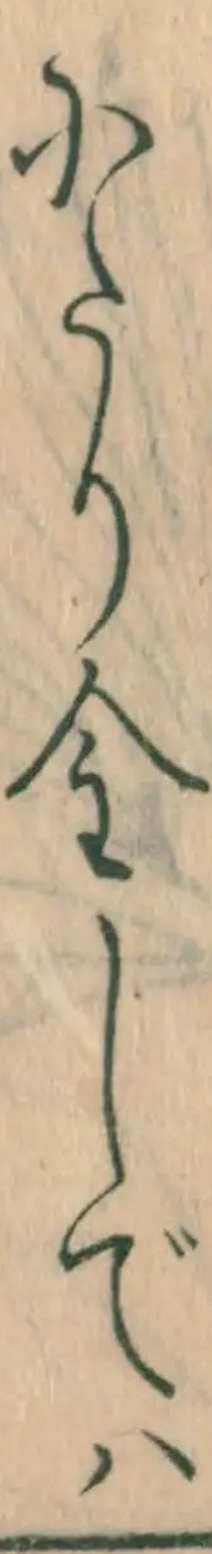にたり金しでは
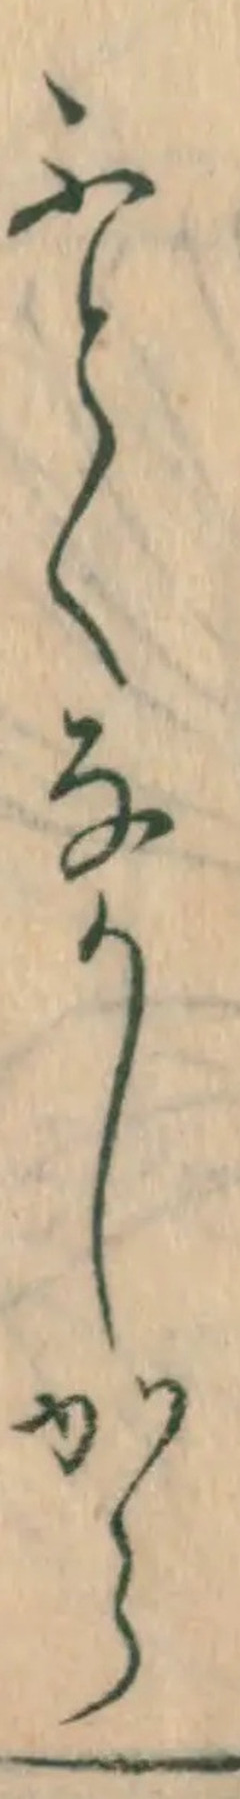ふとくなりしから
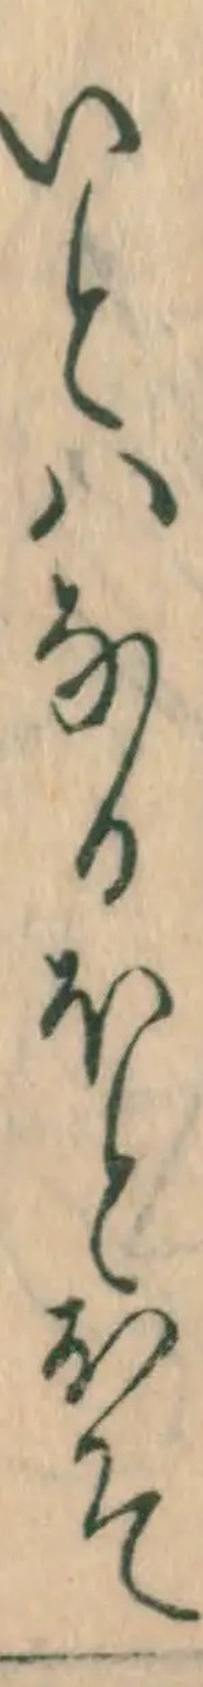いとはなるほとほそ
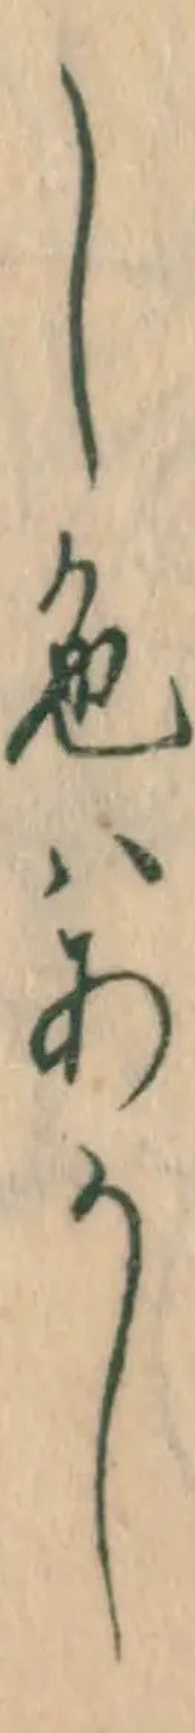し色はあかし
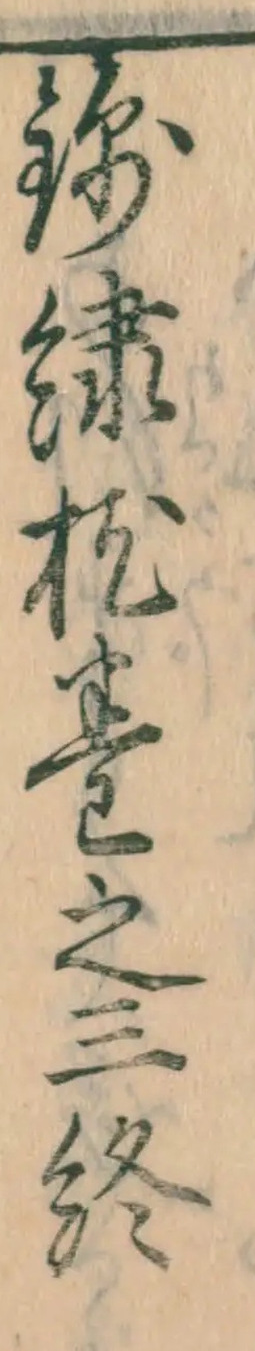錦繍枕巻之三終
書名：錦繍枕 5巻. [3]
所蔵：国立国会図書館 National Diet Library, JAPAN
